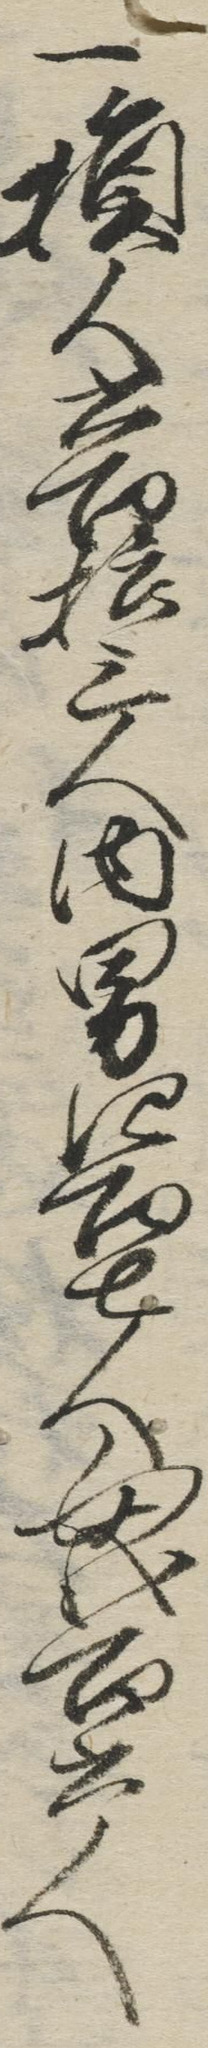一損人六百拾三人内男四百七人女弐百六人
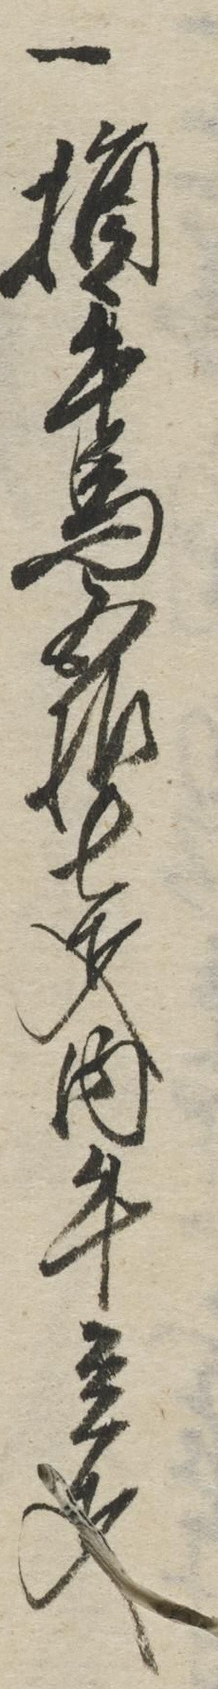一損牛馬五拾七疋内牛壱疋
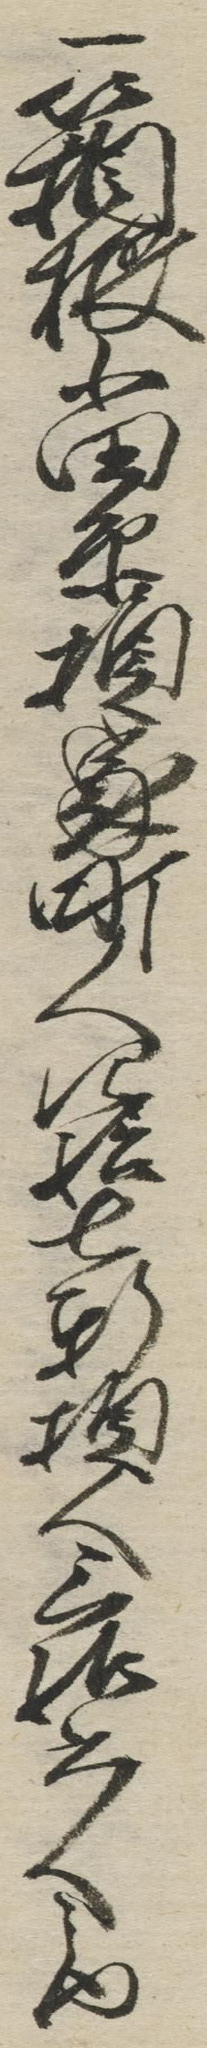一箱根小田原損家町人四拾七軒損人三拾六人内
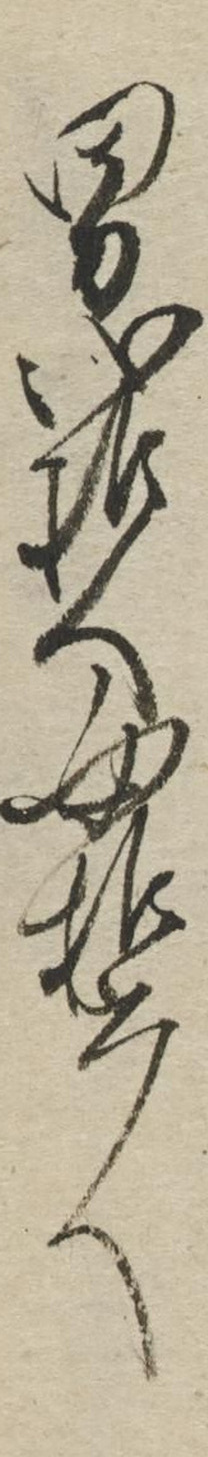男弐拾人女拾六人
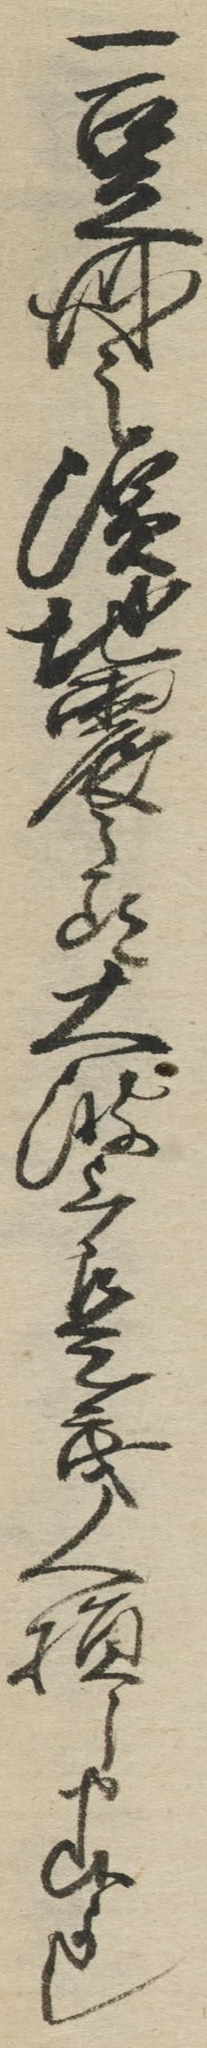一豆洲之濱地震之節大波上候ても人損し申候よし

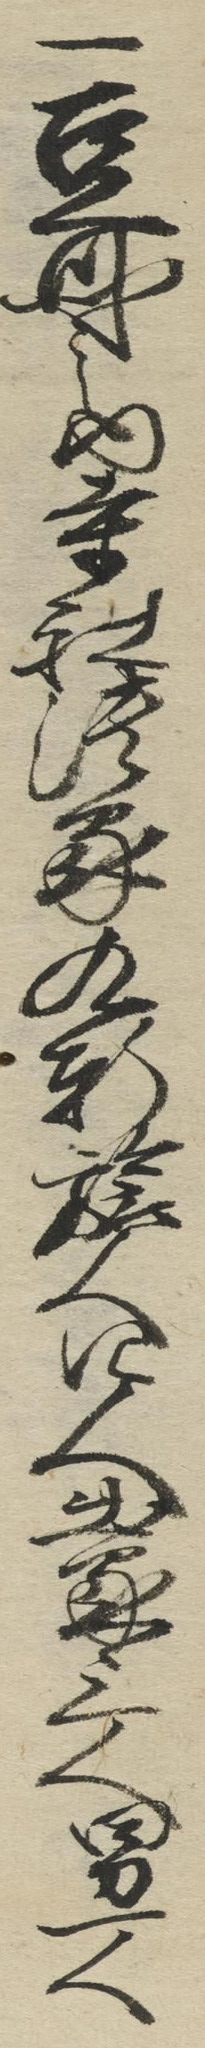一豆洲之内寺社潰家九軒旅人四人出家三人男一人
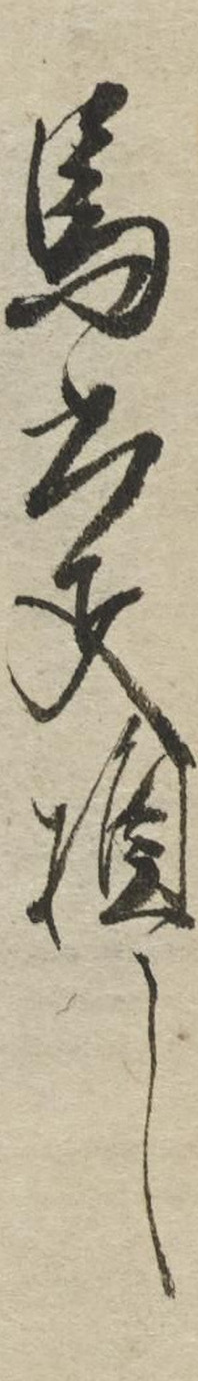馬六疋損し
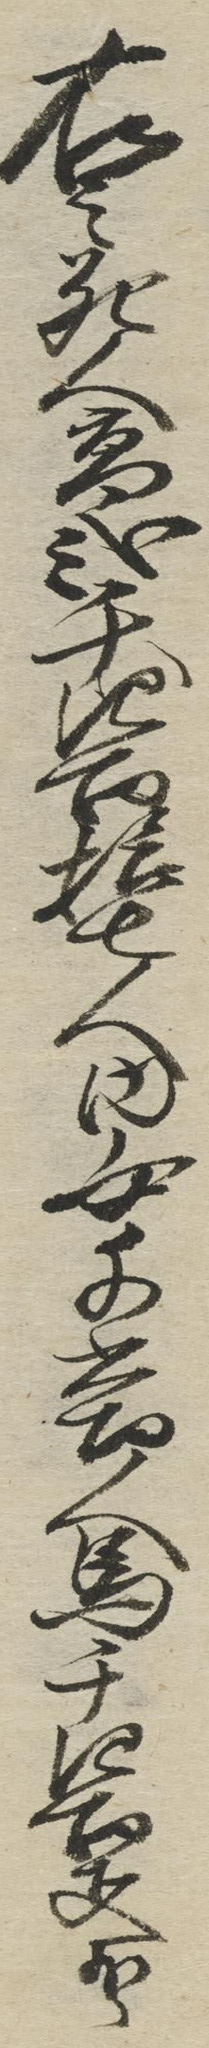右之死人高弐千四百拾七人内女千六拾人馬千四百疋外
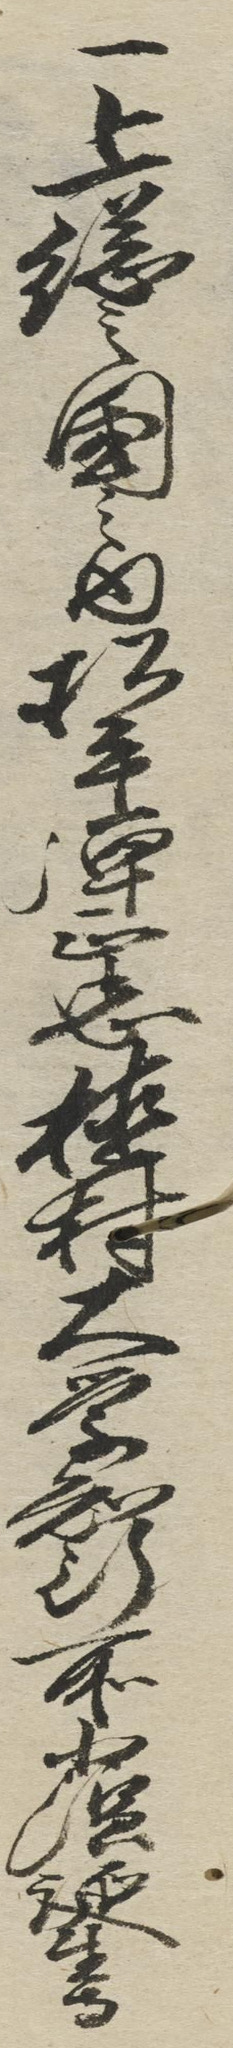一上総之国之内松平弾正忠植村大学知行所小浜誕生寺
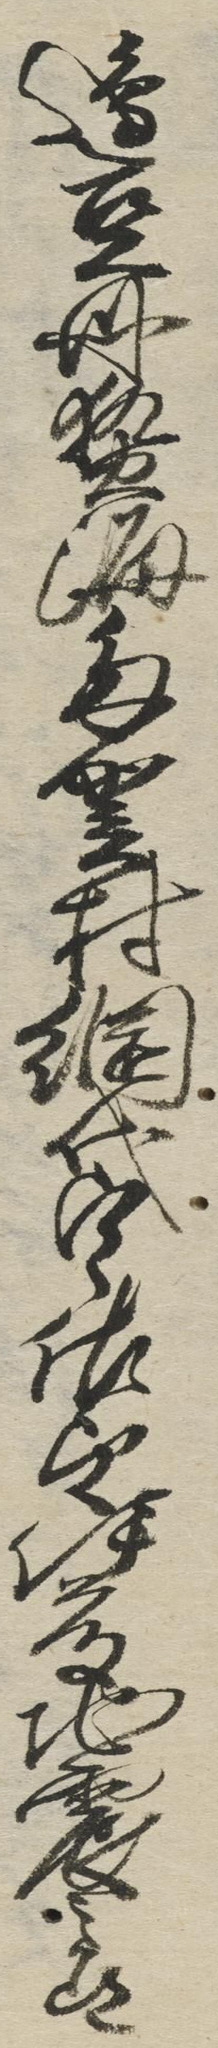辺豆洲熱海多賀村網代宇佐美伊東地震之節
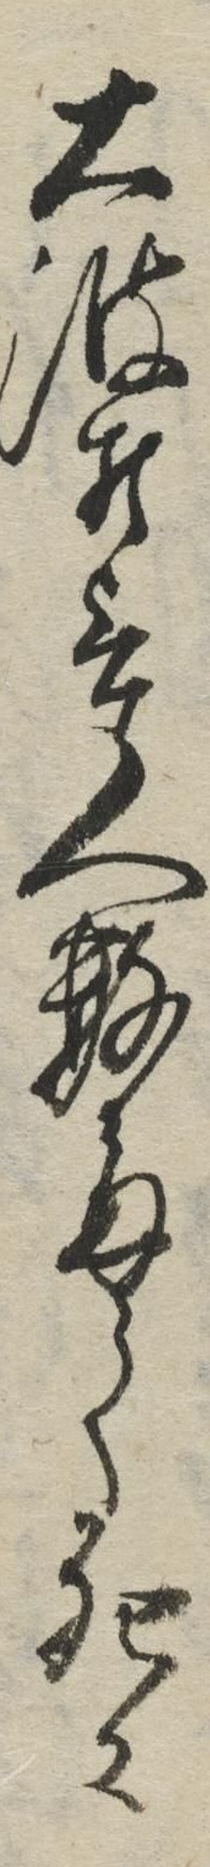大波打上ヶ人数多く死ス
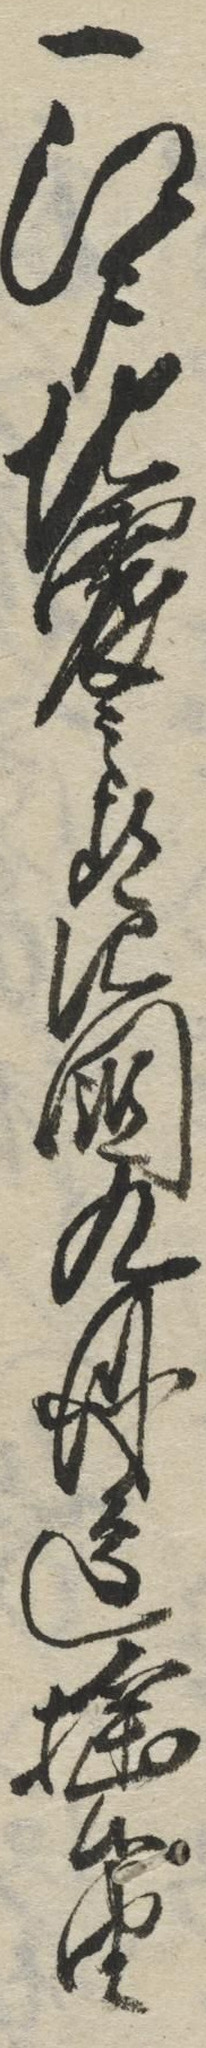一江戸地震之節四国九州辺揺候由
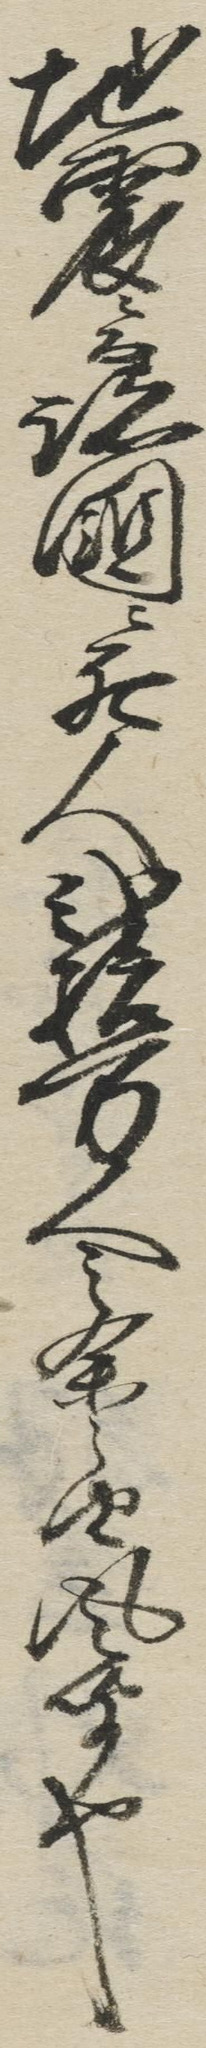地震二而諸国二死人弐拾万人之余之由風聞也
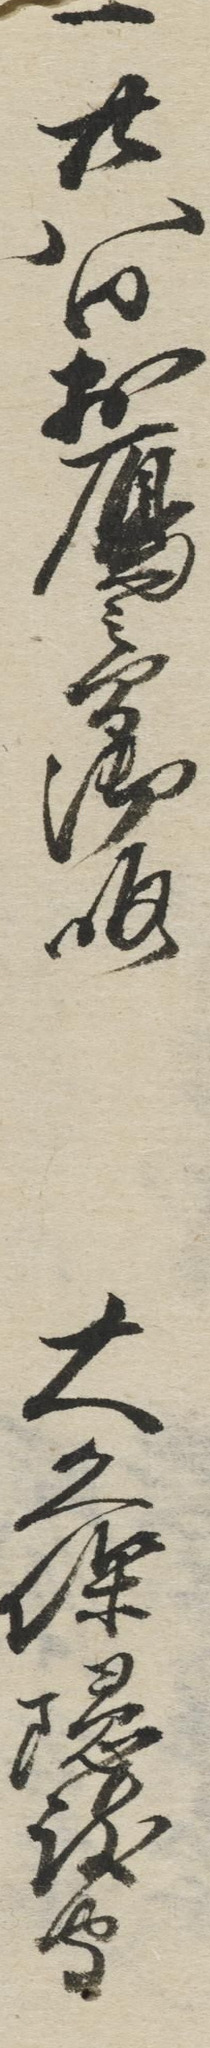一廿八日於鳫之間御呼大久保隠岐守
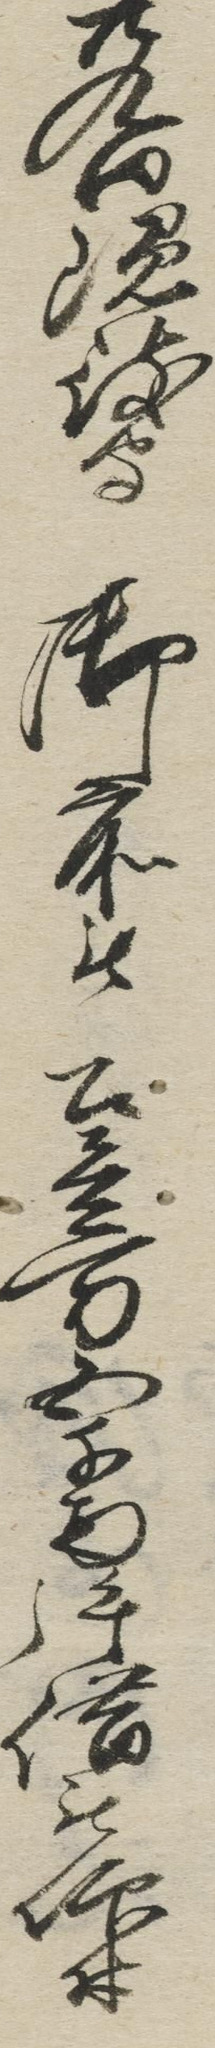廿九日隠岐守御前被召壱万五千両拝借被仰付
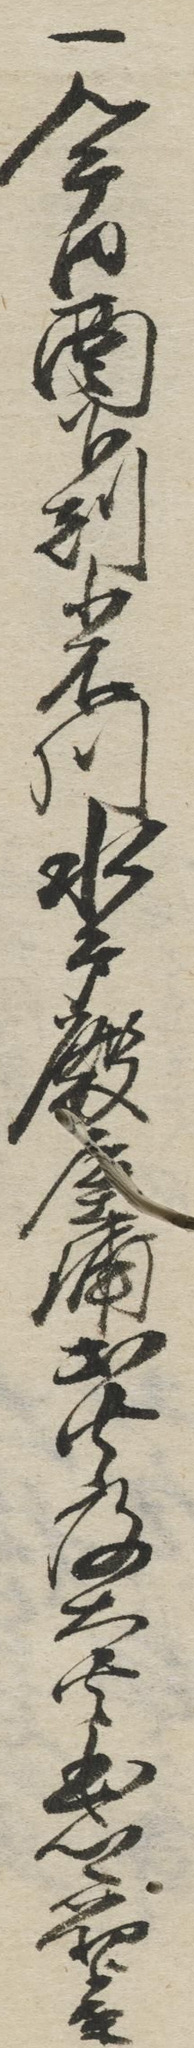一今日酉下刻小石川水戸殿屋鋪出火及大火本郷筋より
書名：元禄地震記
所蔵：東京大学地震研究所図書室 Earthquake Research Institute Library, The University of Tokyo, JAPAN
